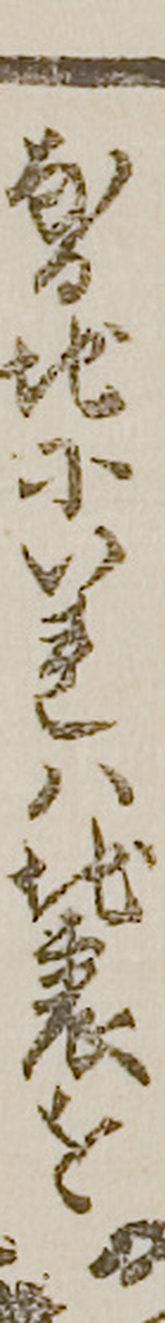なる地にいれハ地表を
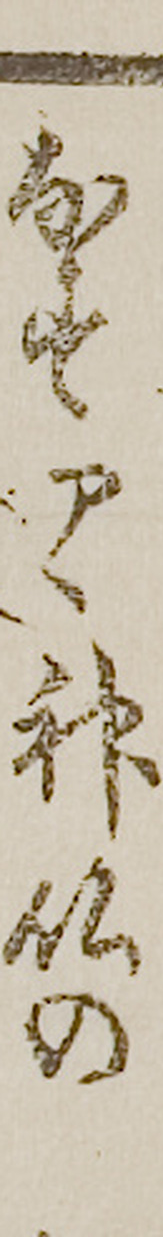なすアア神仏の
